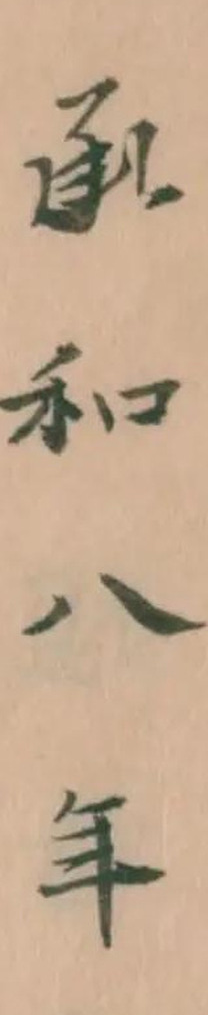承和八年
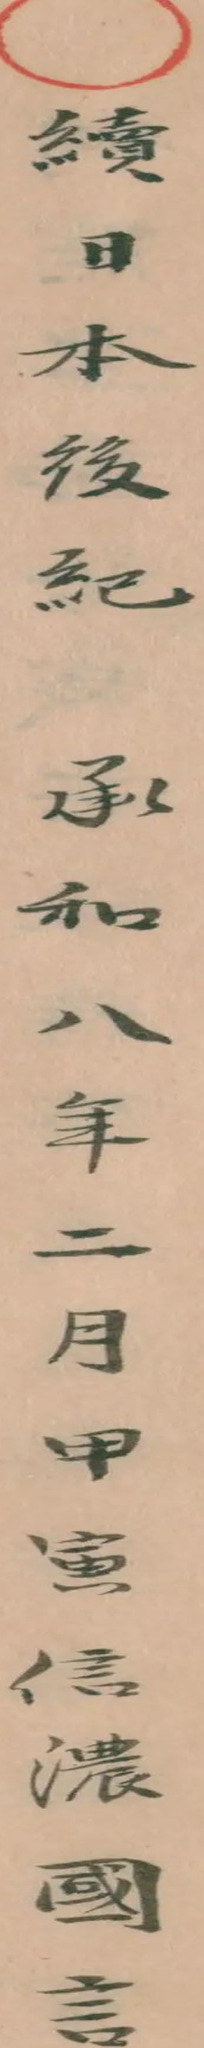○続日本後紀承和八年二月甲寅信濃国言
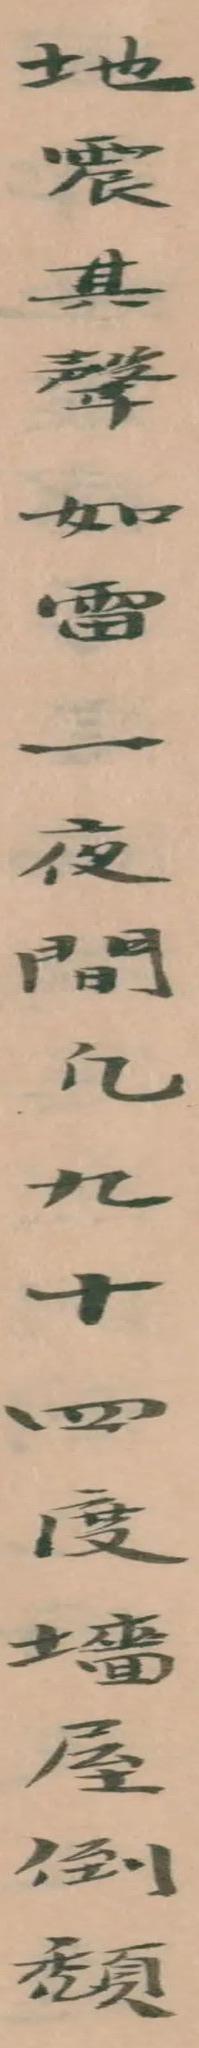地震其声如雷一夜間凡九十四度墻屋倒頽
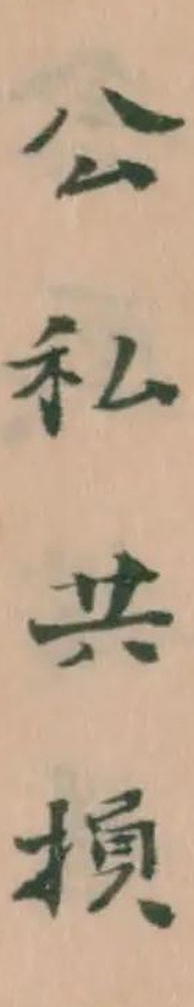公私共損
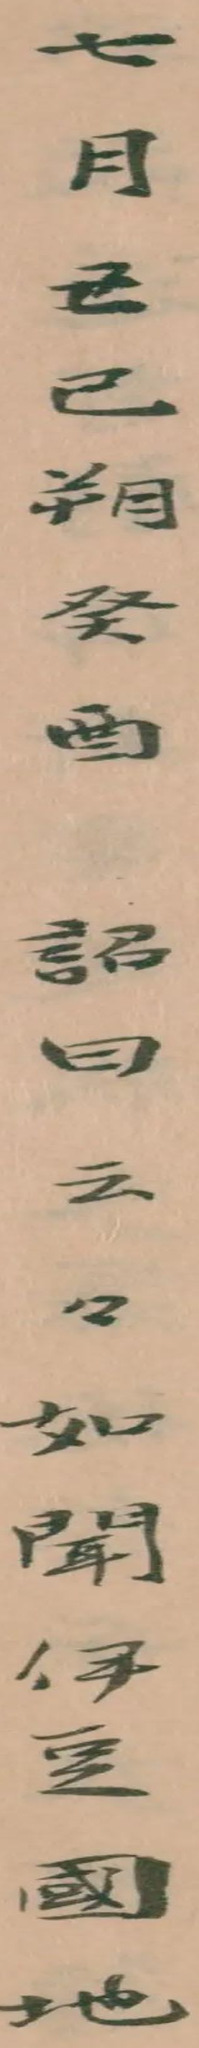七月己巳朔癸酉詔曰云々如聞伊豆国地
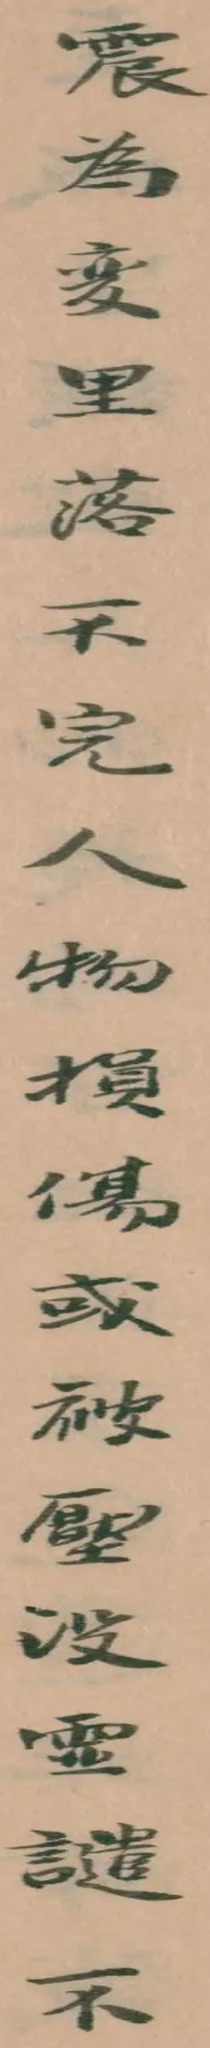震為変里落不完人物損傷或被圧没霊譴不
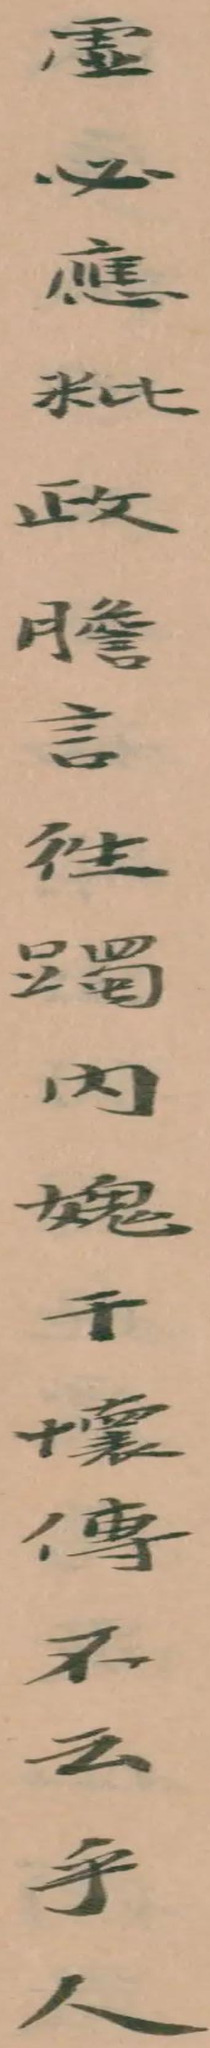霊必応粃政膽言往躅内媿于懐伝不云乎人
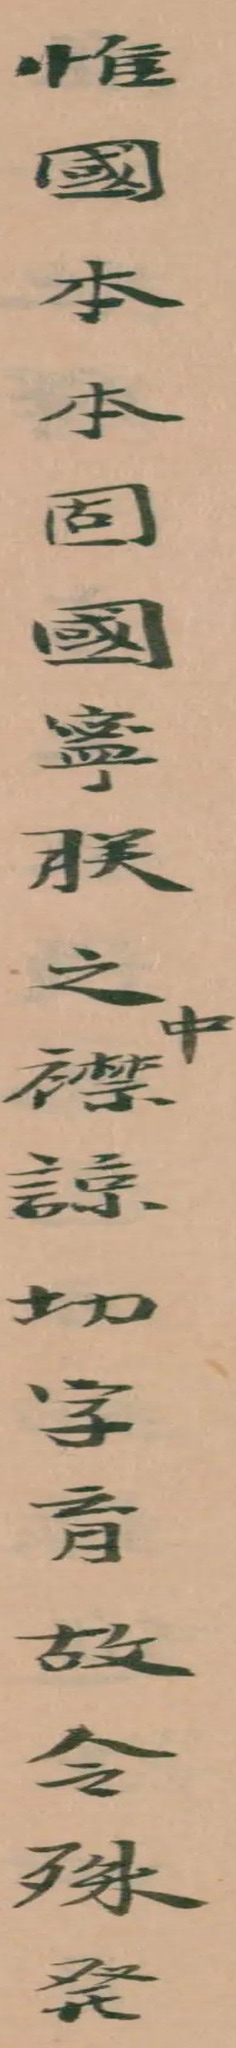惟国本本固国寧朕之中襟諒功字育故令殊発
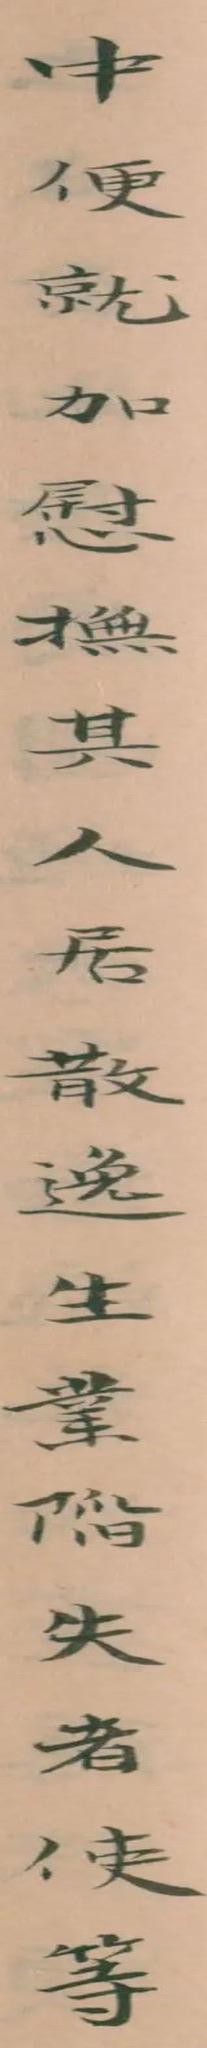中便就加慰撫其人居散逸生業陥失者使等
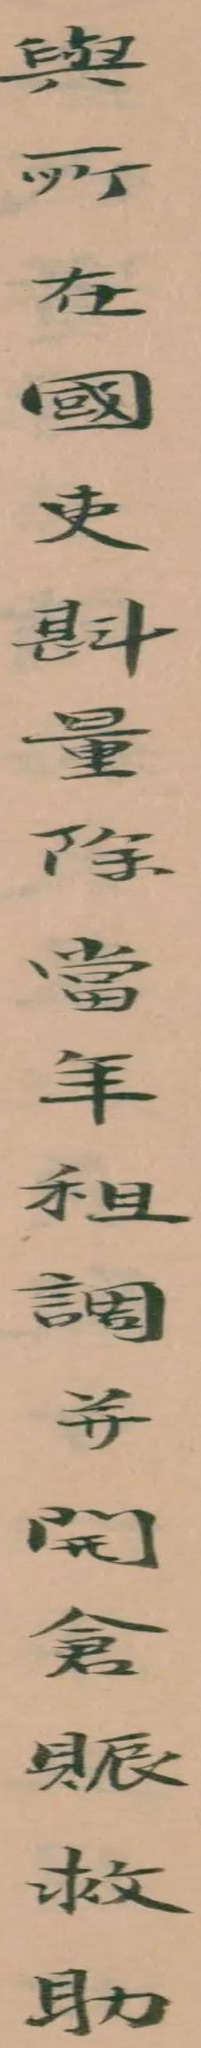與所在国吏斟量除当年租調幷開倉賑救助
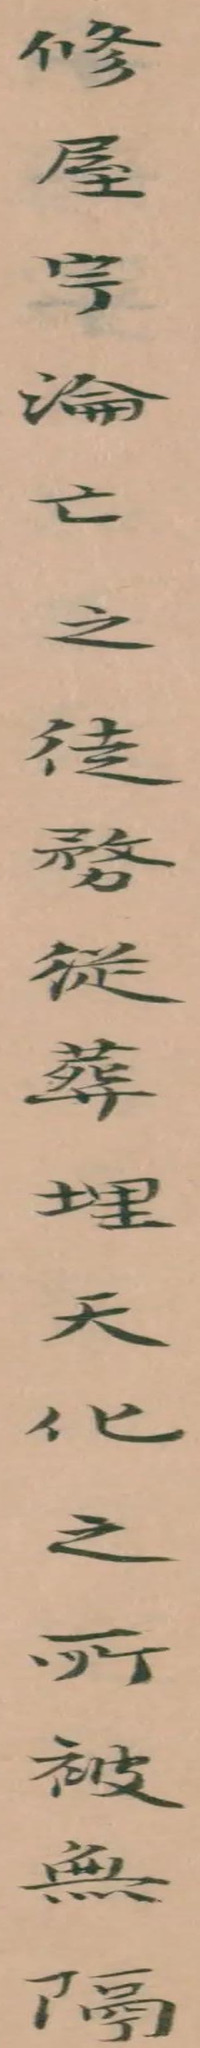修屋宇淪亡之徒務従葬埋天化之所被無隔
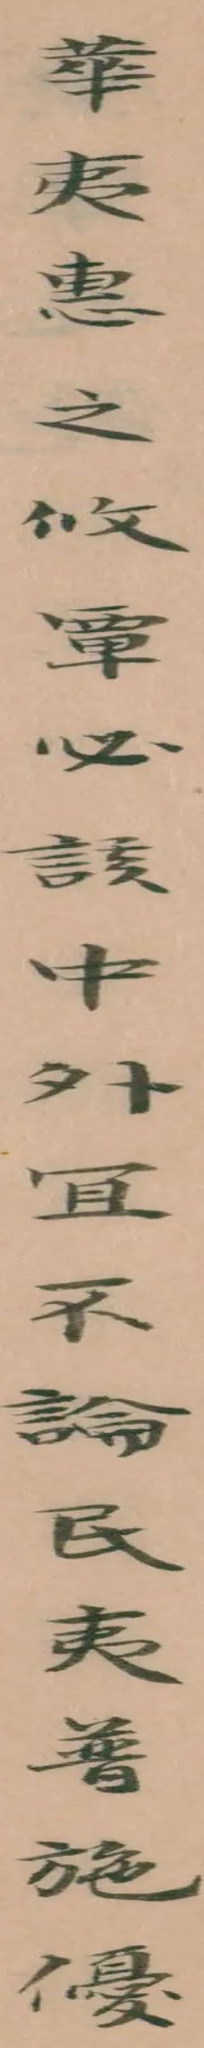華夷恵之攸覃必該中外宜不論民夷普施優
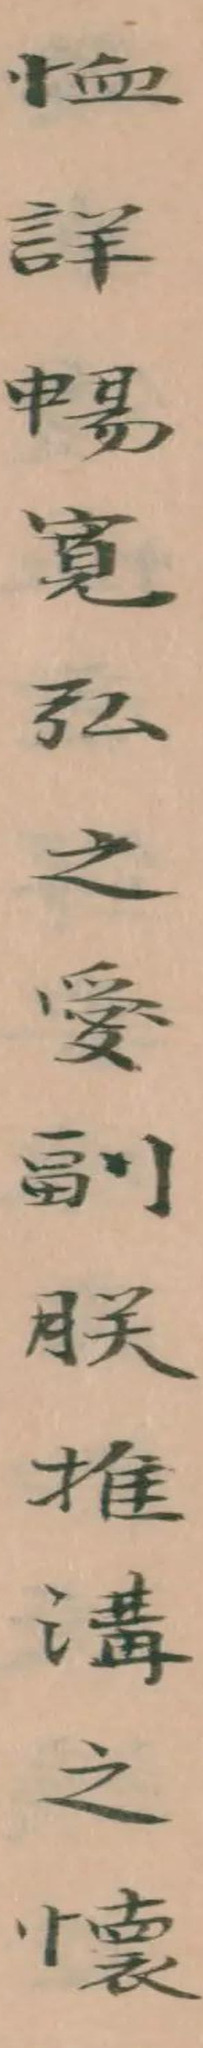恤詳暢寛弘之愛副朕推溝之懐
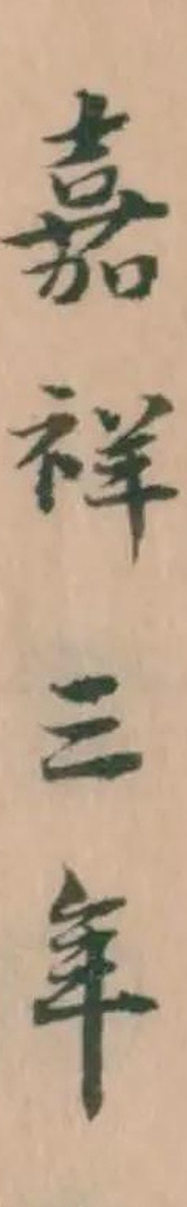嘉祥三年
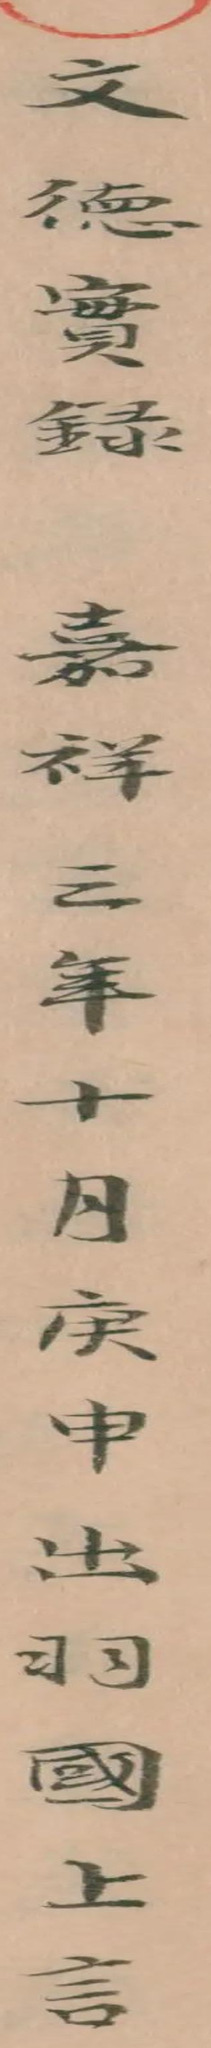○文徳実録嘉祥三年十月庚申出羽国上言
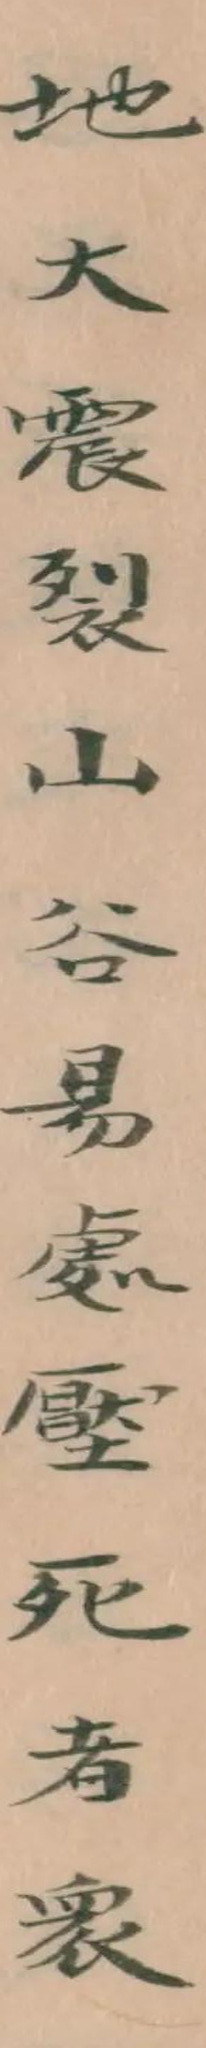地大震裂山谷易処圧死者衆
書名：地災撮要. 巻5-6(地震之部)
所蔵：国立国会図書館 National Diet Library, JAPAN
